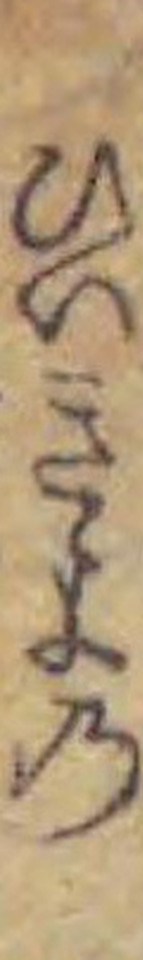ひいきよの
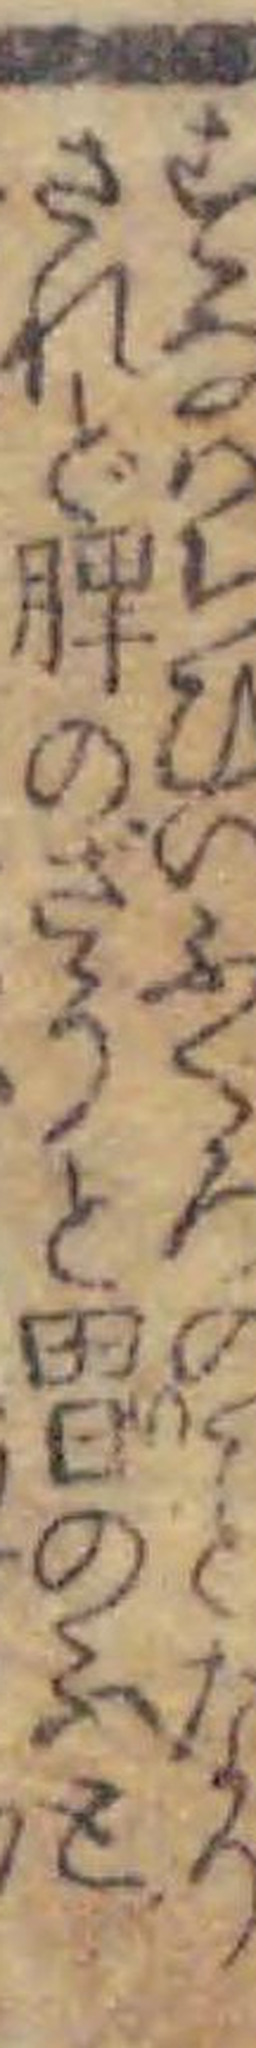されど脾のざうと胃のふと
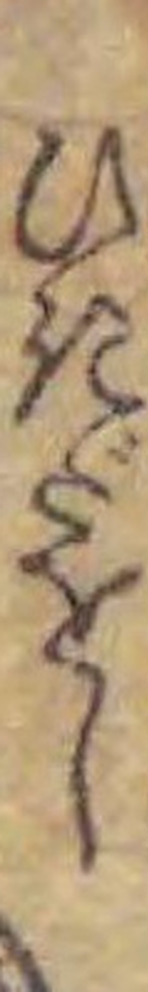ひきだをし
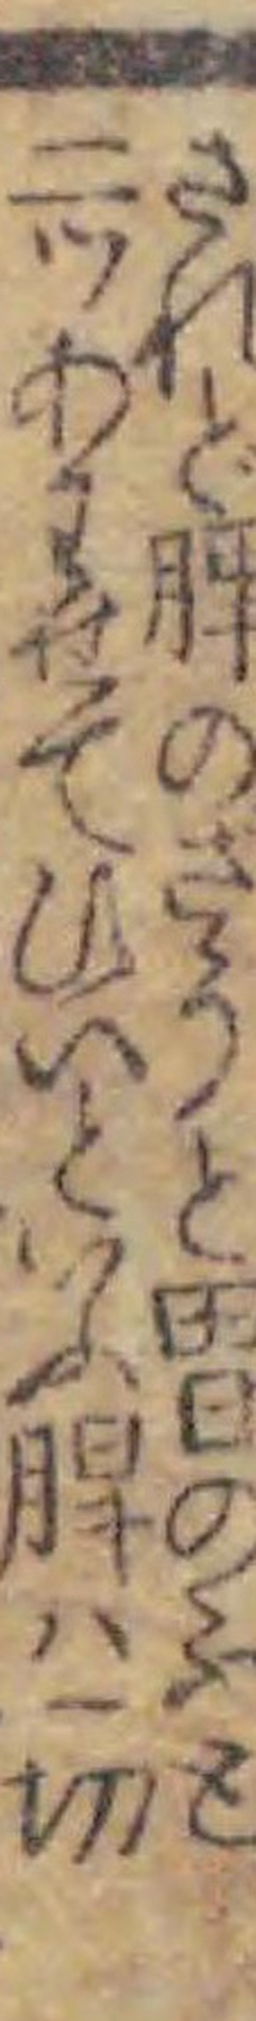二ツあわせてひいといふ脾は一切
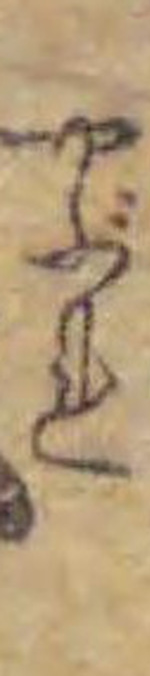やぶれ
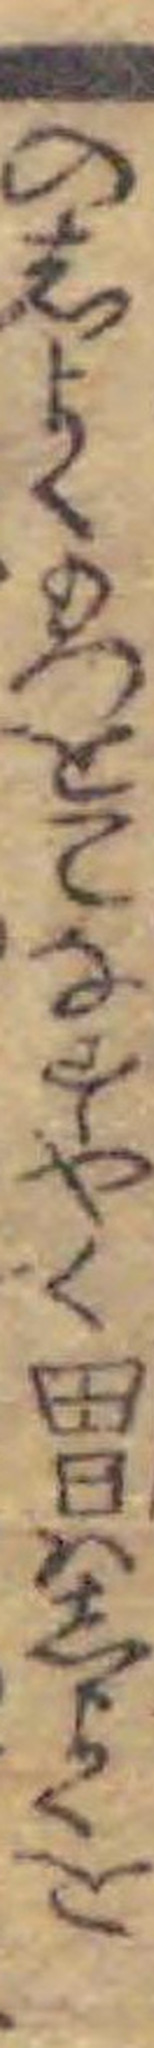のしよくもつをこなすやく胃はしよくを
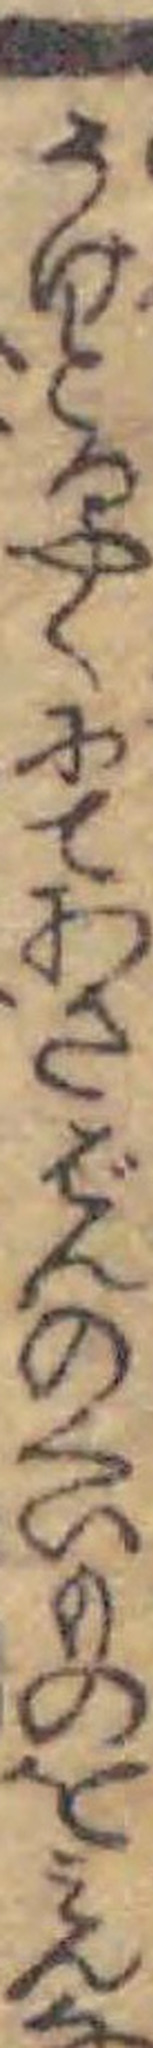うけとるやくにてあさばんのくいものをみん
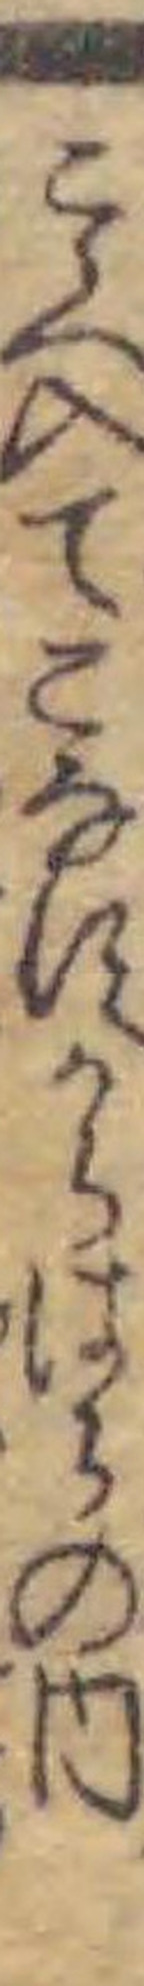こゝへ入てこなすからはらの内
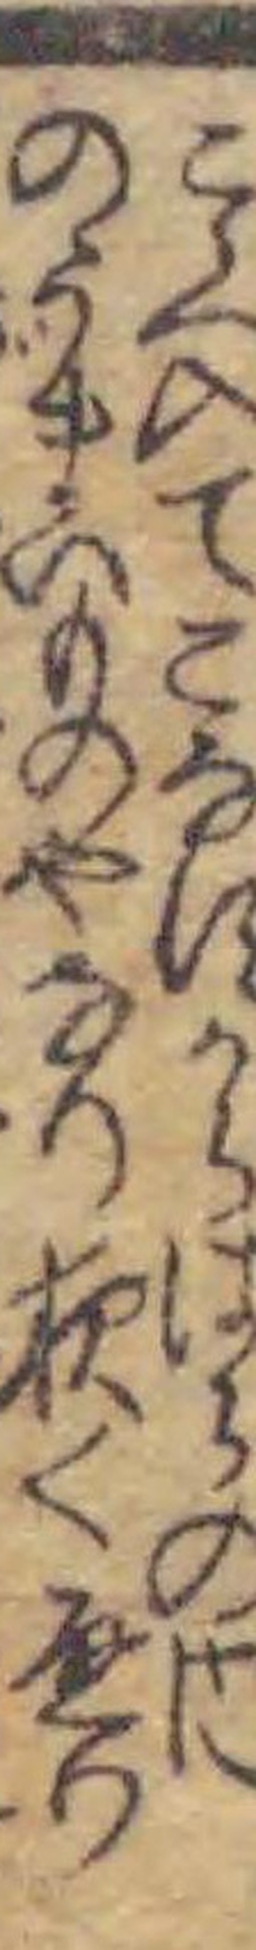のうまいものやなり夜〳〵通り
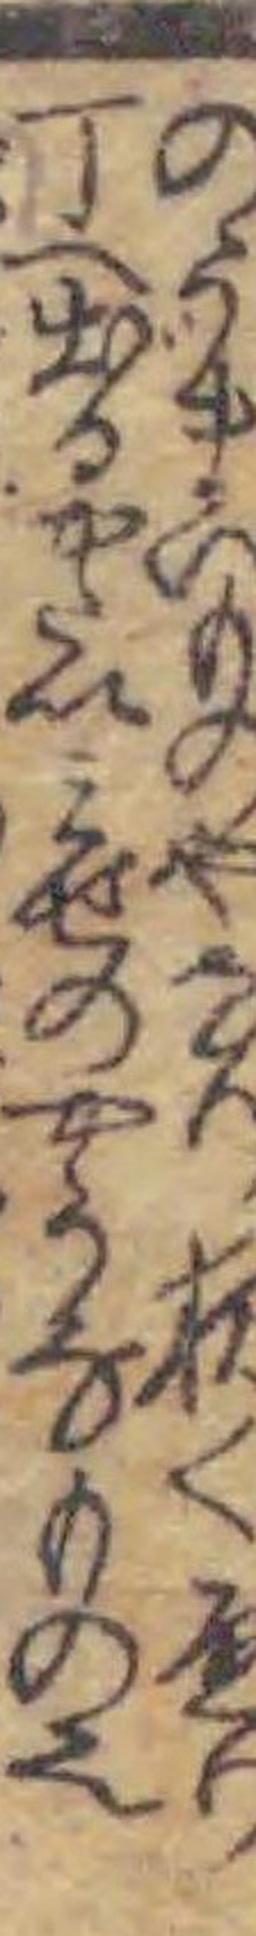丁へ出るやたいみせのやうなもの也
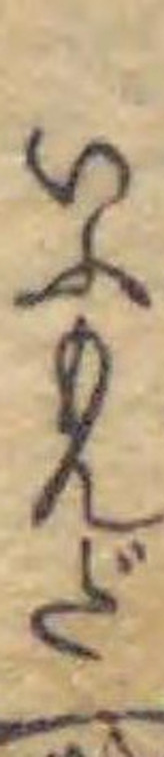いふもんだ
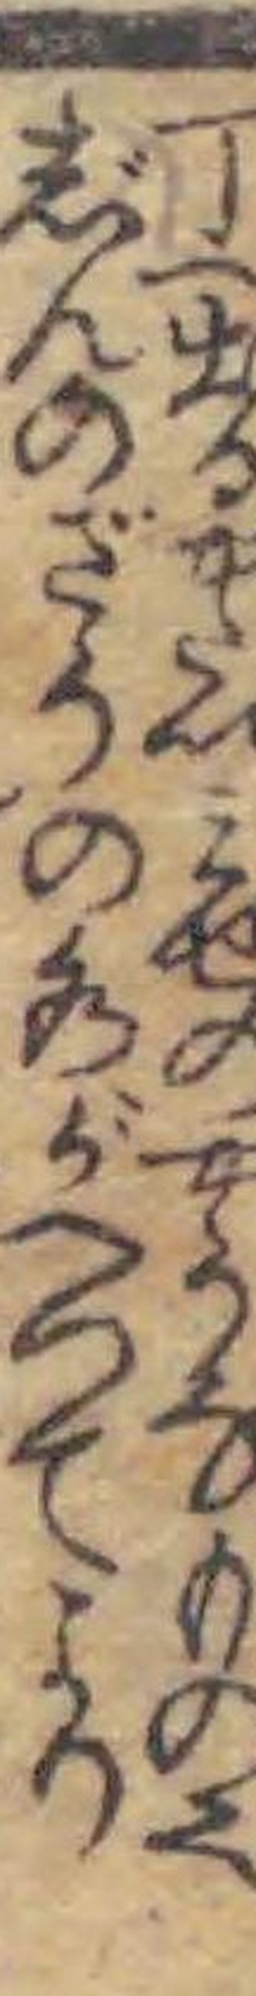じんのざうの水がへつてより
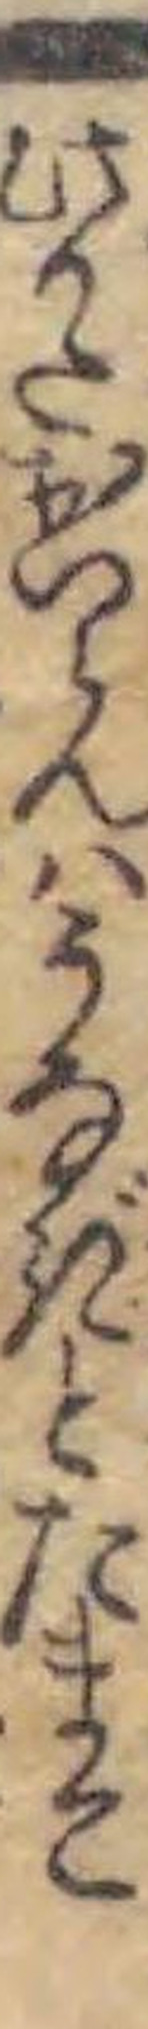此かたおいらんはうなぎとたまこ
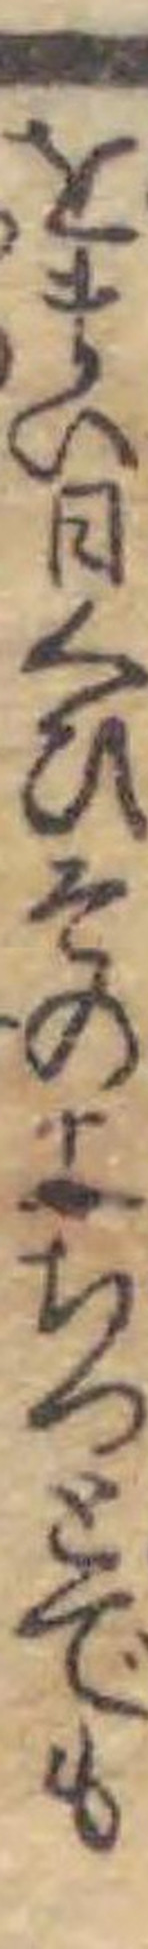をまい日くひそのよちつとでも
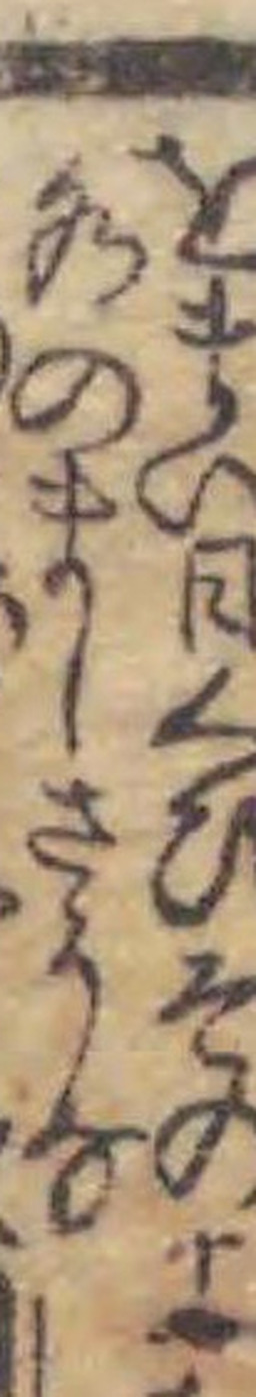水のましさうな
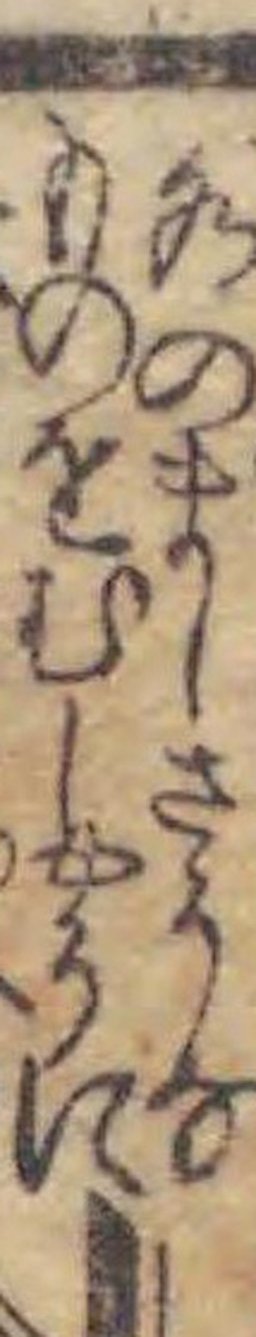ものをむしやうに
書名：十四傾城腹之内 : 3巻
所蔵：国立国会図書館 National Diet Library, JAPAN
